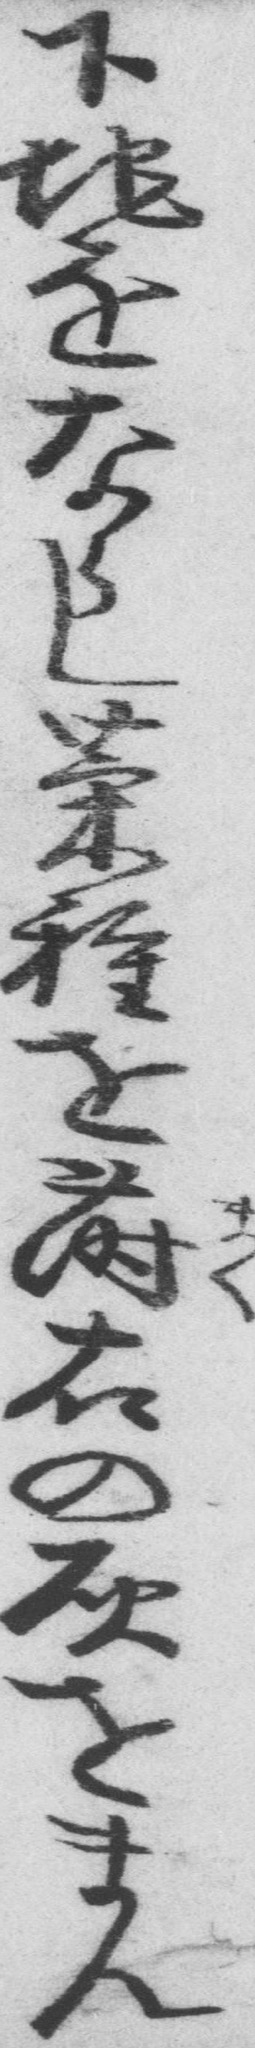下地をならし菜種を蒔右の灰をまん
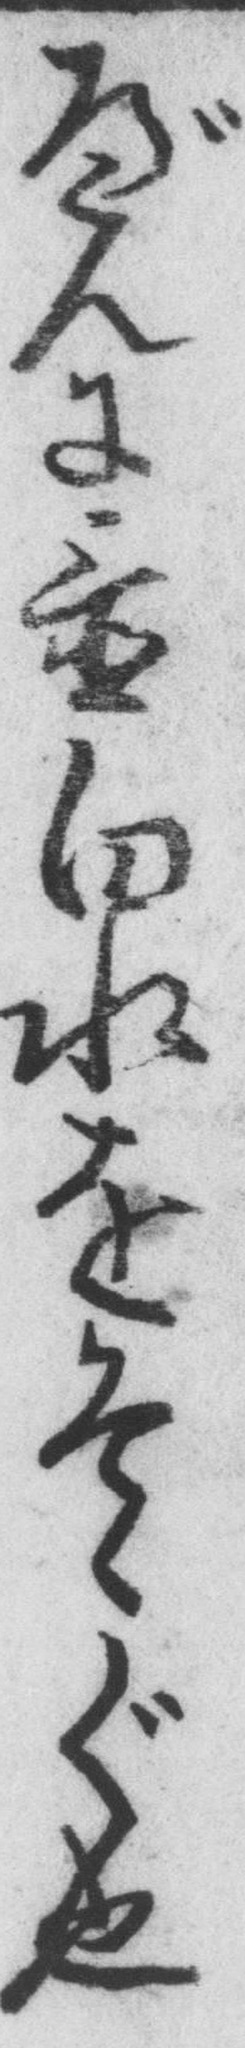べんに置白水をそゝぐ也
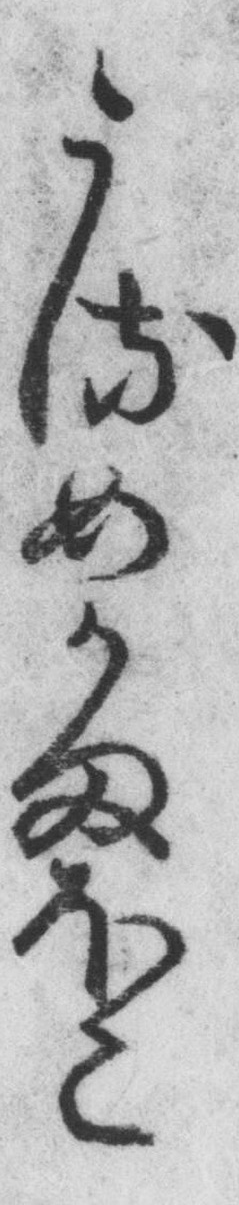うるめかまほこ
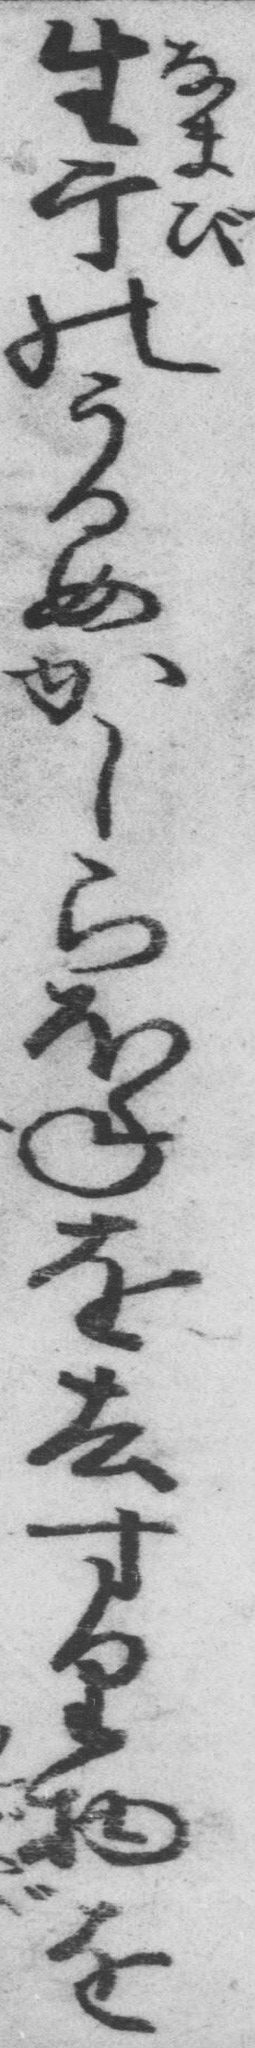生干のうるめかしらほねを去すり物を
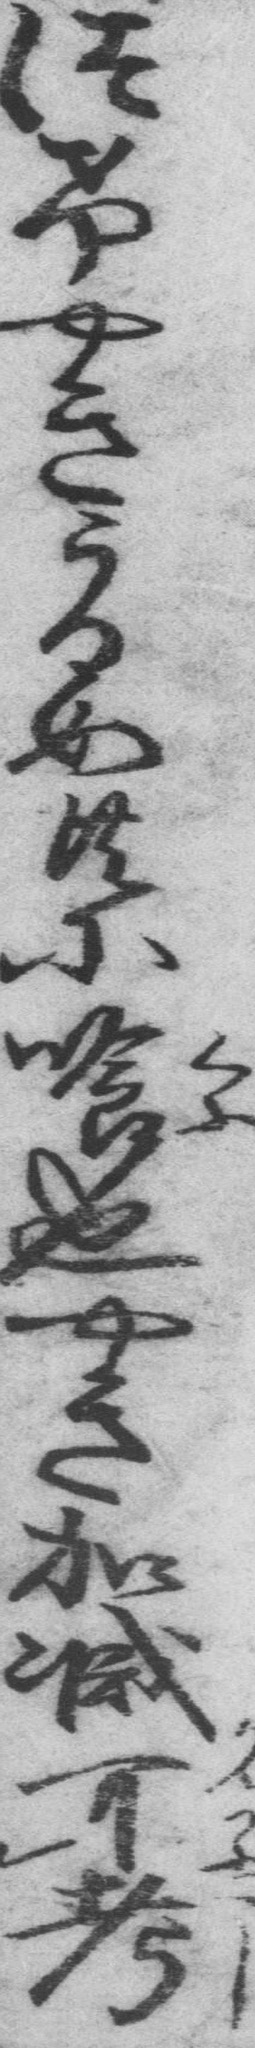つけやきうるめ共に喰也やき加減可考

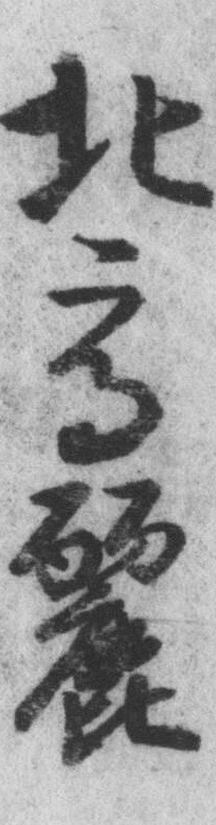北高麗
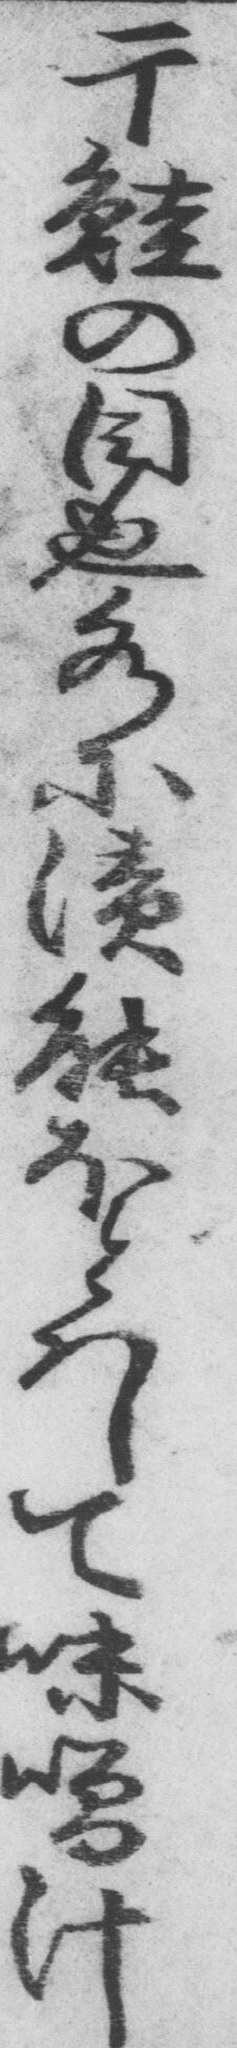干鮭の目也水に漬能ほとはして味噌汁
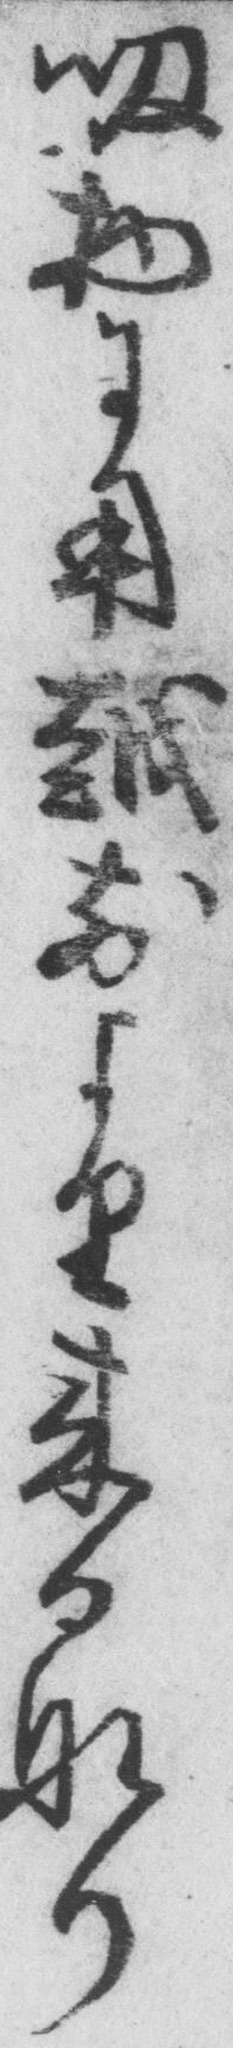吸物に用越前より来るなり
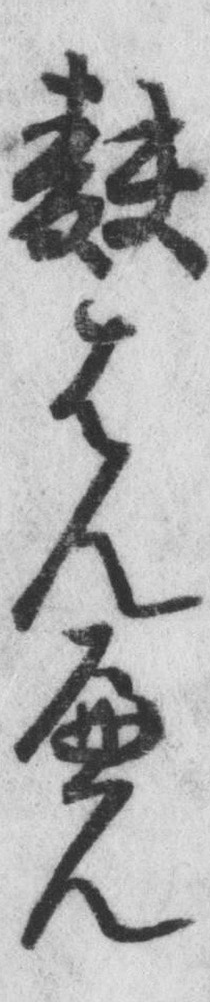麩はんへん
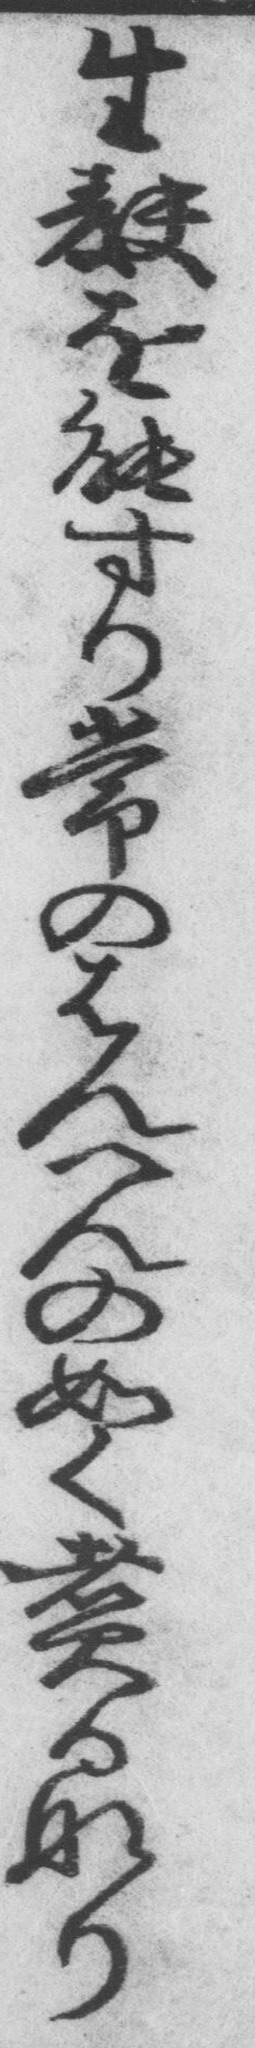生麩を能すり常のはんへんの如く煮るなり
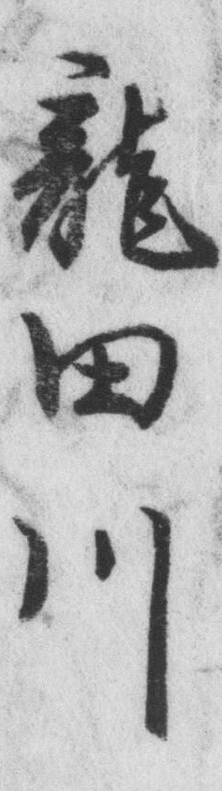竜田川
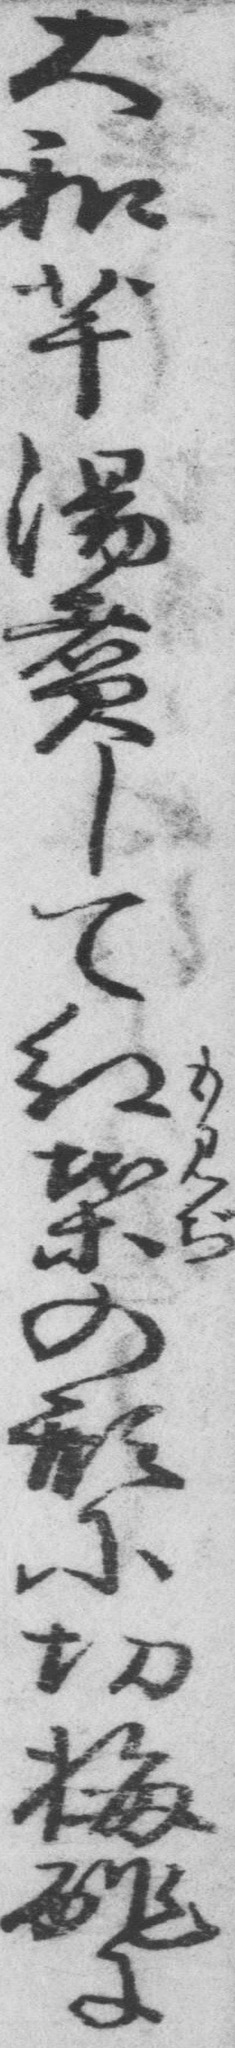大和芋湯煮して紅葉の形に切梅酢に
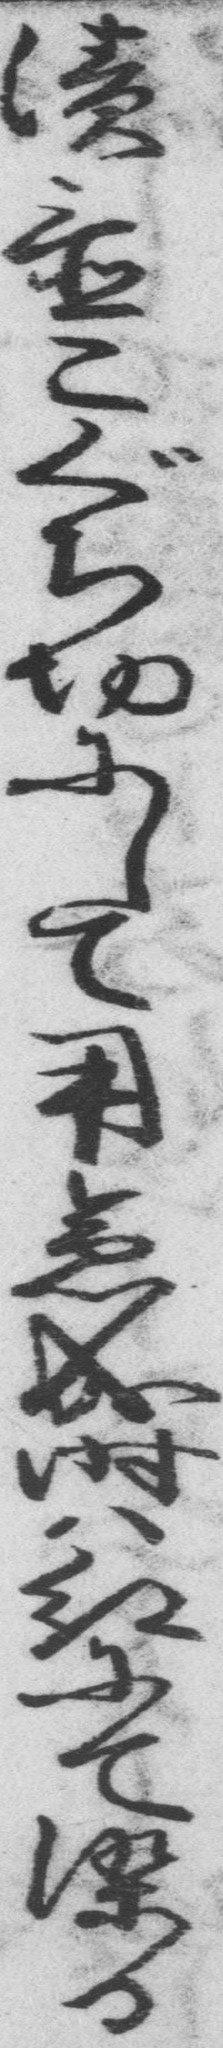漬置こぐち切にして用急成時は紅にて染る
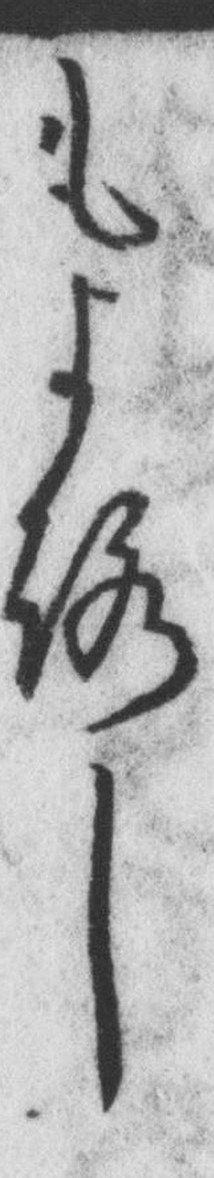もよろし
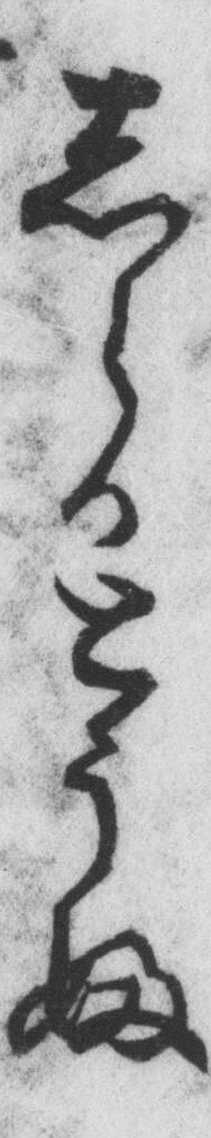しらかとうふ
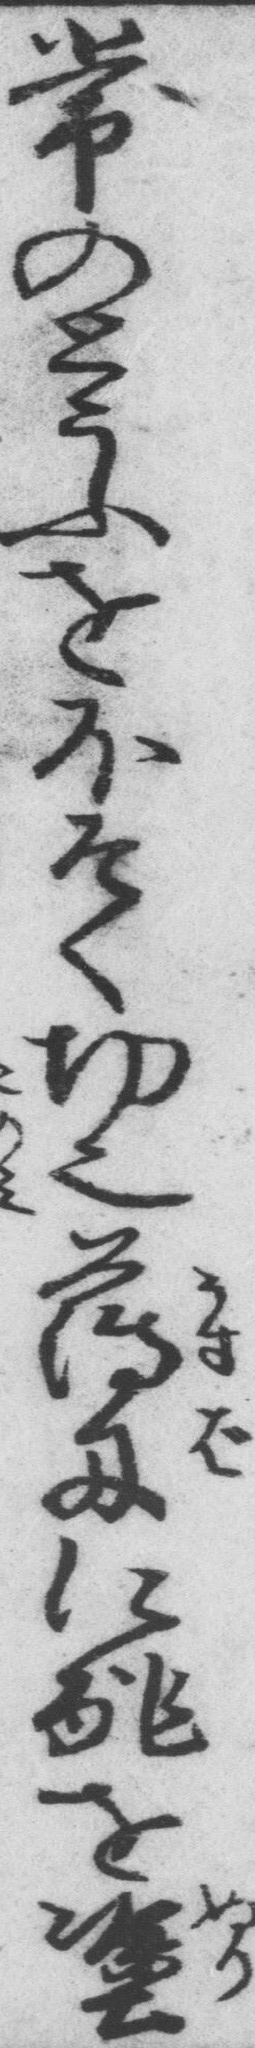常のとうふをほそく切也薄刃に酢を塗
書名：料理山海郷
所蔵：大阪府立大学学術情報センター 国文学研究資料館
